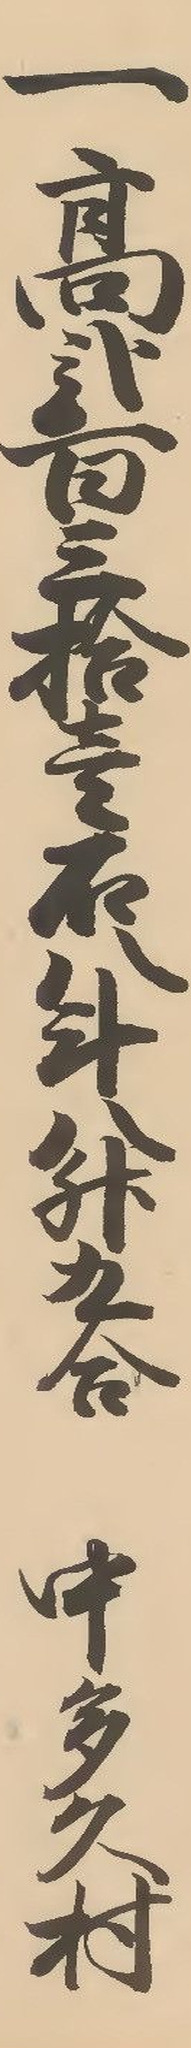一髙弐百三拾壱石八斗八升九合中多久村
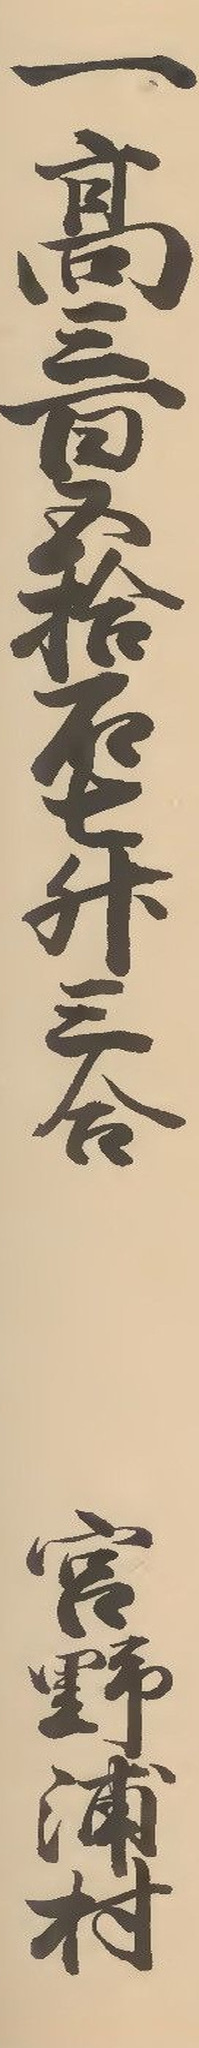一髙三百五拾石七升三合宮野浦村
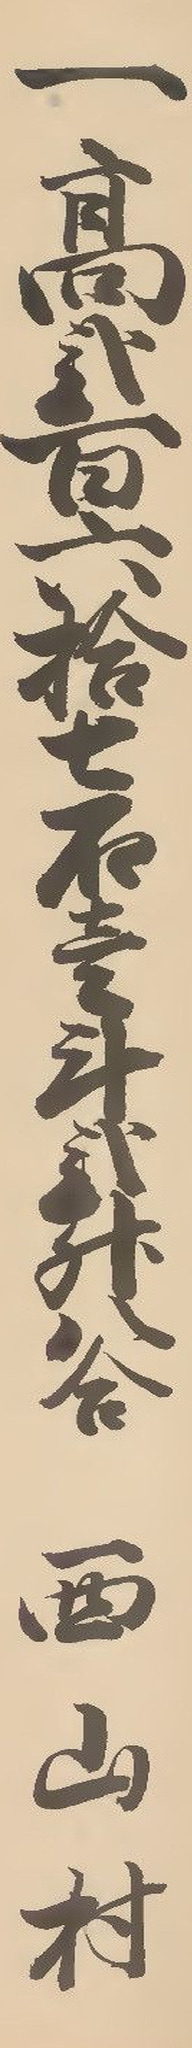一髙弐百六拾七石壱斗弐升八合西山村
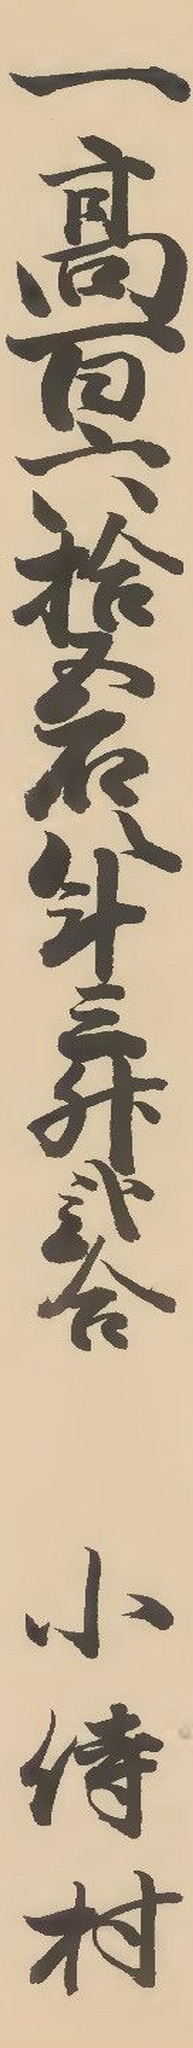一髙百六拾五石八斗三升弐合小侍村
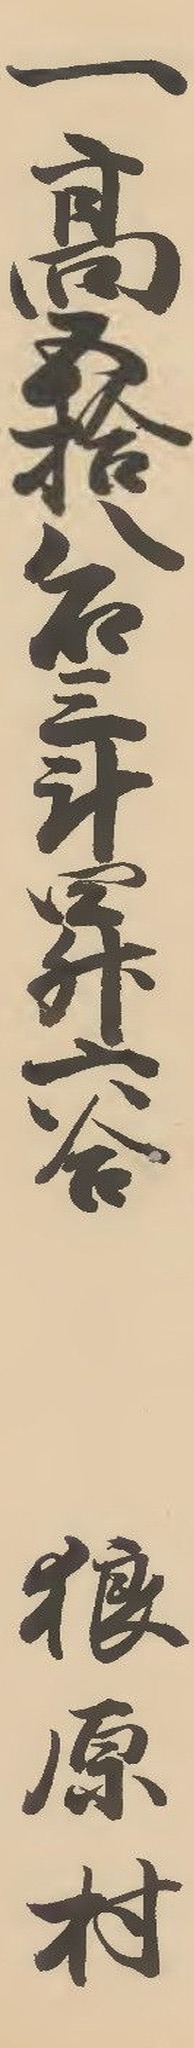一髙五拾八石三斗四升六合狼原村
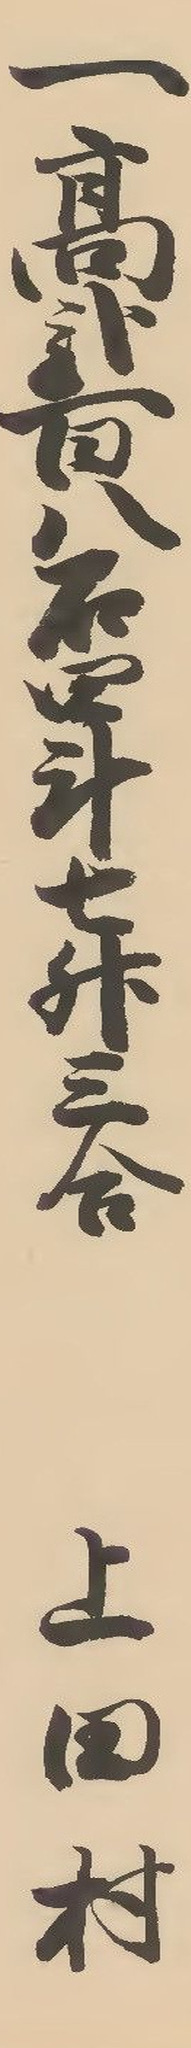一髙弐百八石四斗七升三合上田村

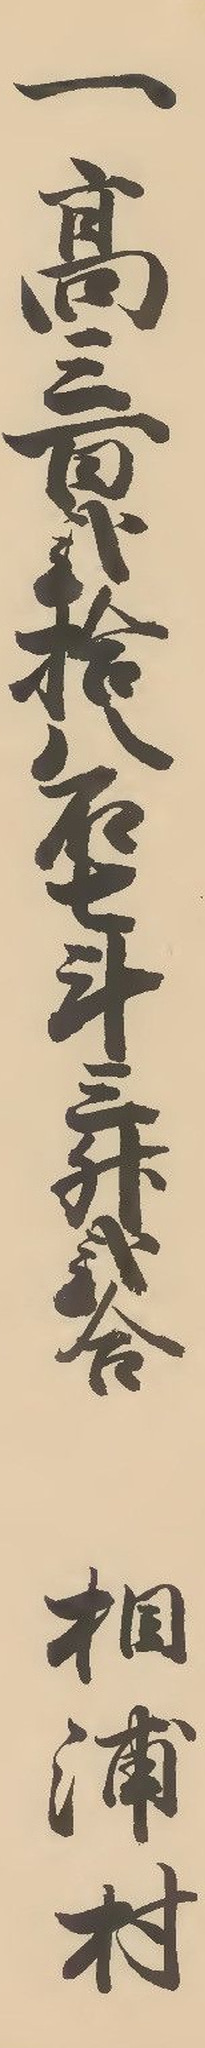一髙三百弐拾八石七斗三升弐合相浦村
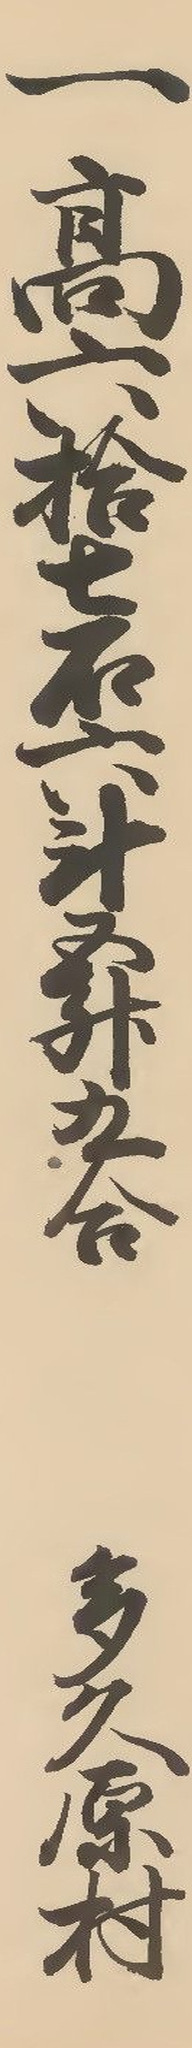一髙六拾七石六斗五升九合多久原村
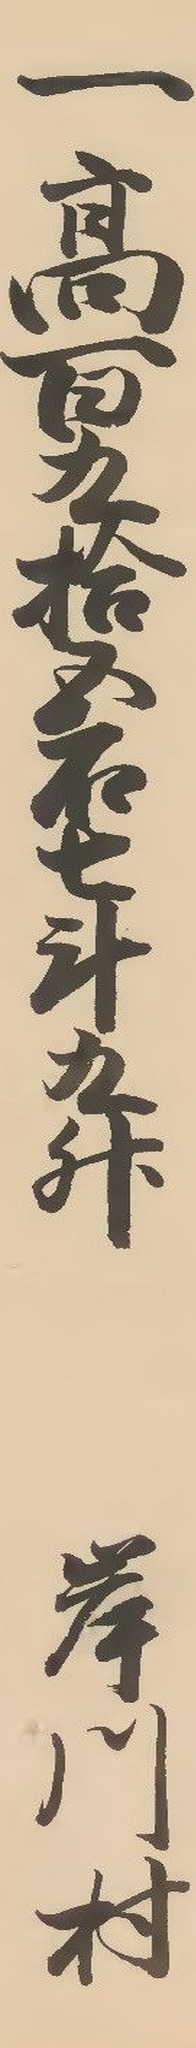一髙百九拾五石七斗九升岸川村
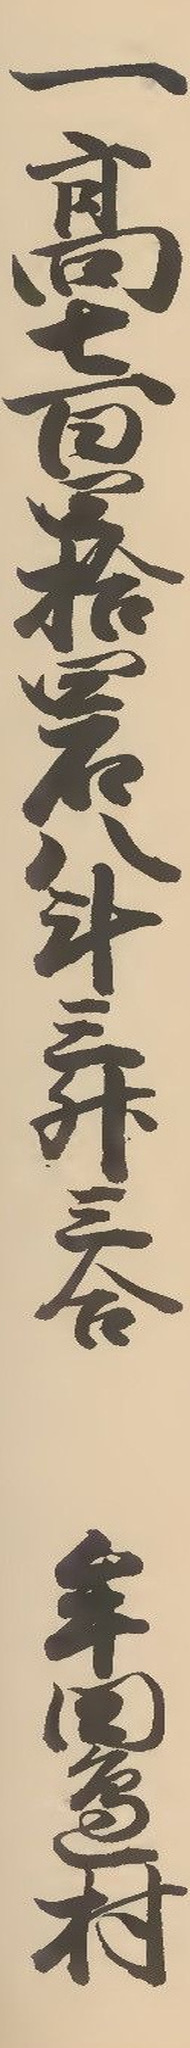一髙七百四拾四石八斗三升三合牟田邊村
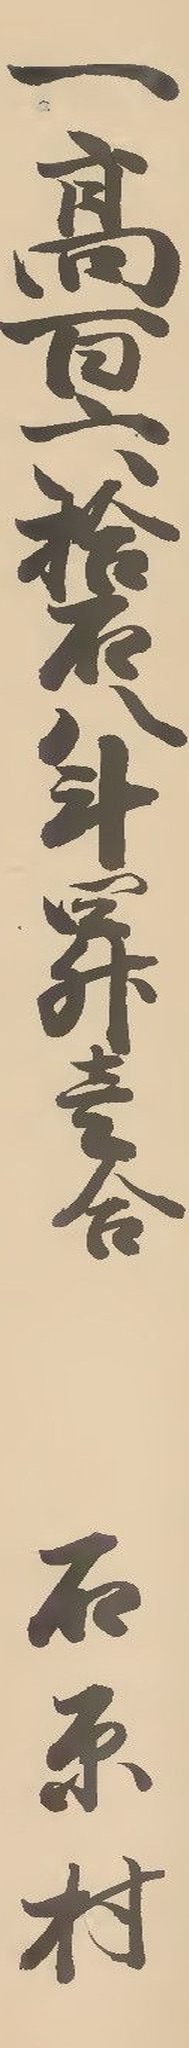一髙百六拾石八斗四升壱合石原村
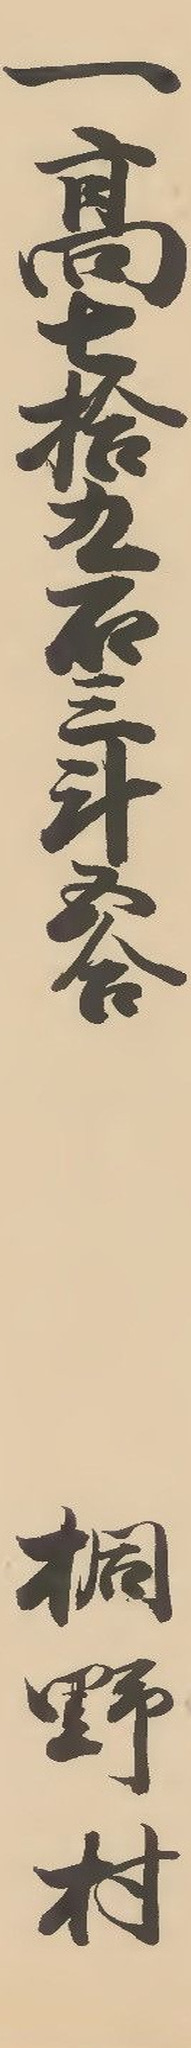一髙七拾九石三斗五合桐野村
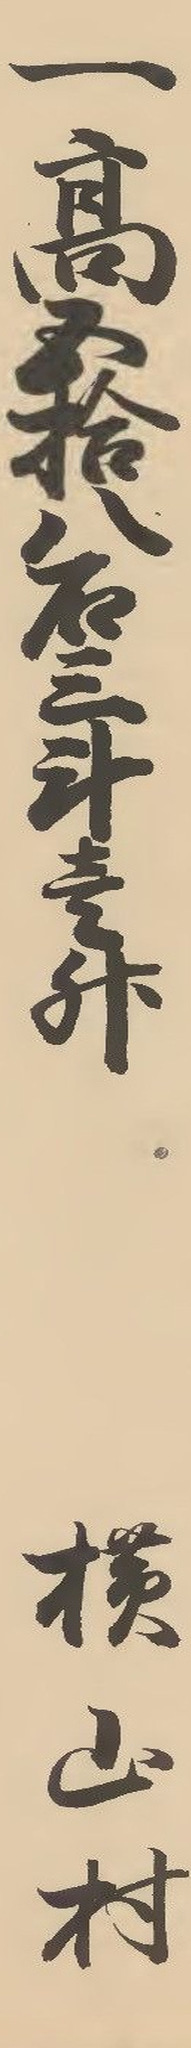一髙五拾八石三斗壱升横山村
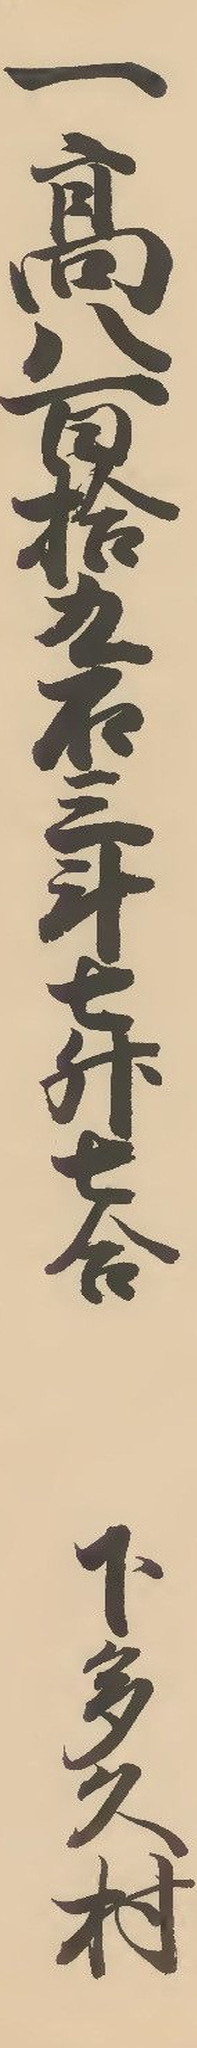一髙八百拾九石三斗七升七合下多久村

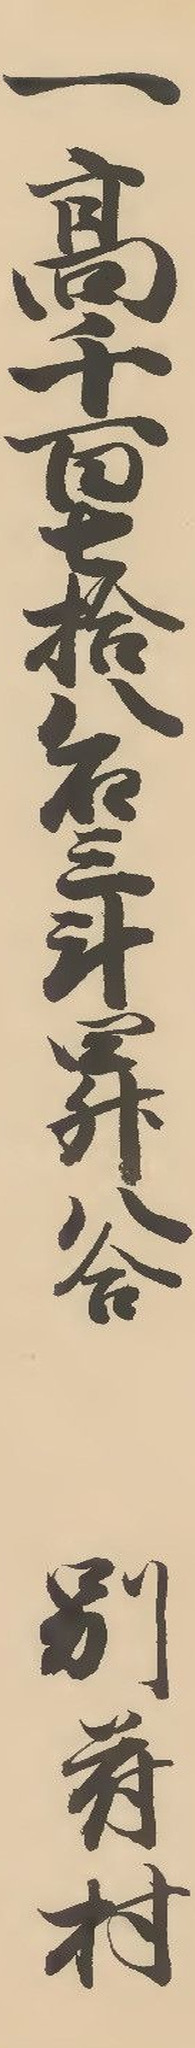一髙千百七拾八石三斗四升八合別府村
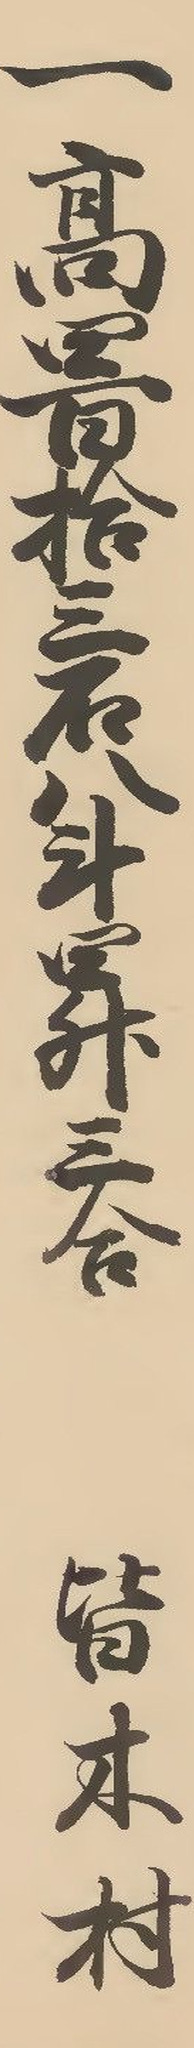一髙四百拾三石八斗四升三合皆木村
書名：肥前国郷帳
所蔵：国立公文書館 National Archives of Japan
